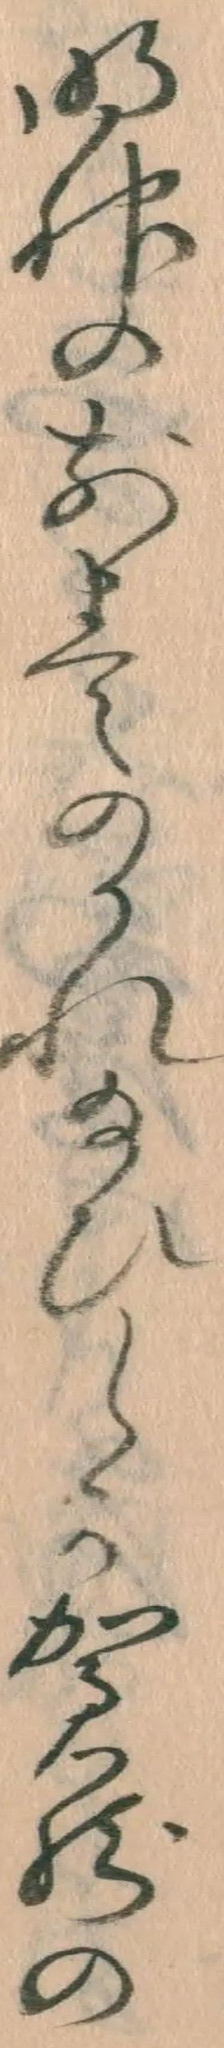明神の前まてのかれ玉ひしか駕籠の
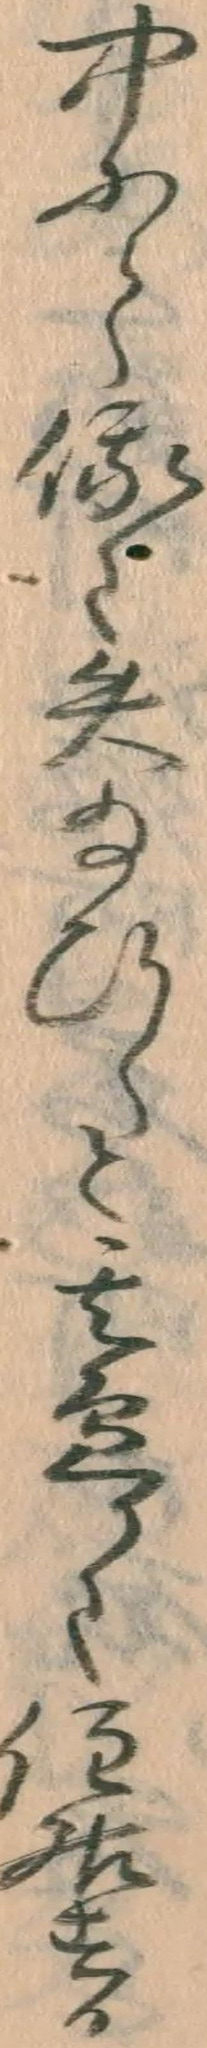中にて俄に失玉ひしと其邊に住居する
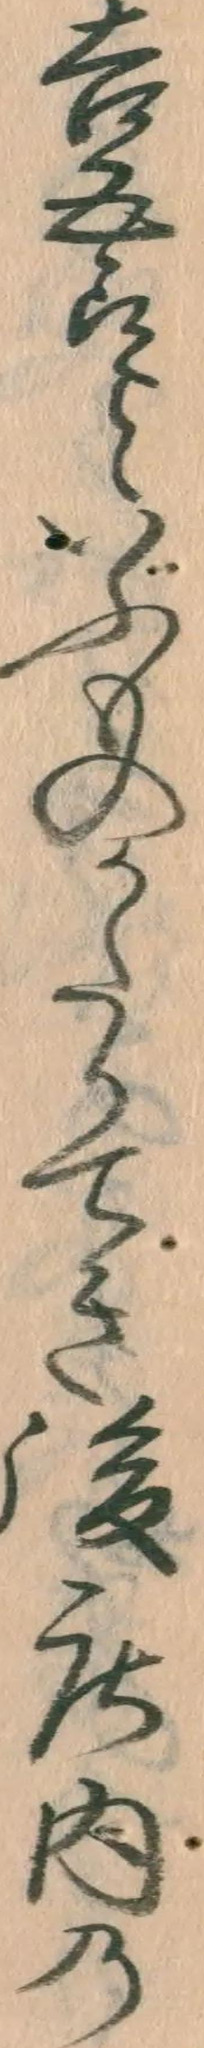吉五郎といふものかたりて其後庄内の
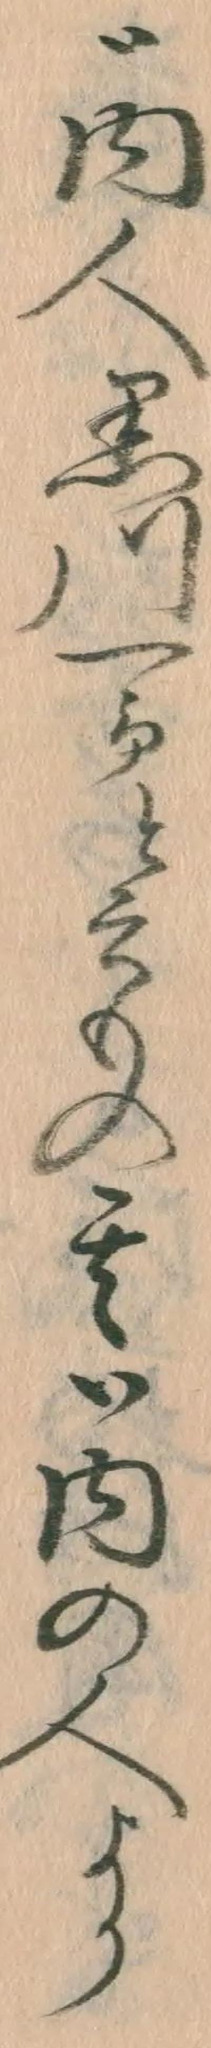御内人黒川一郎と云もの其御内の人より
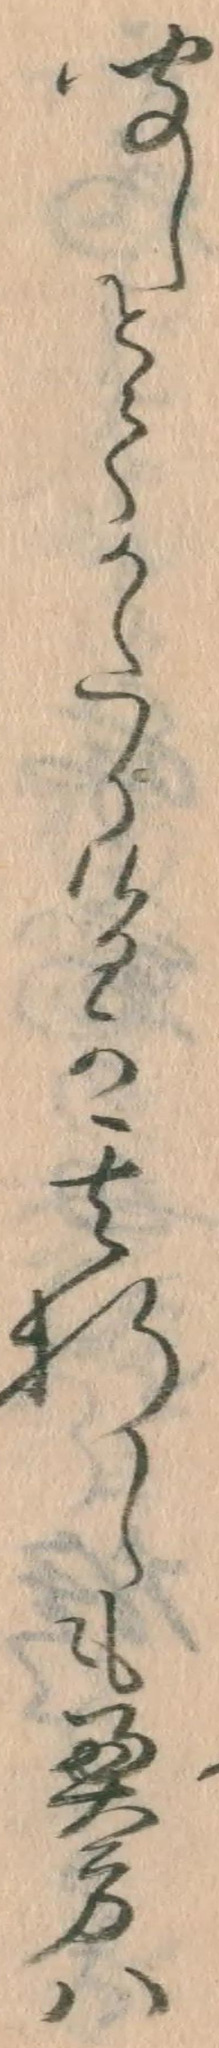聞しとてかたりけるか其折しも奥方ハ
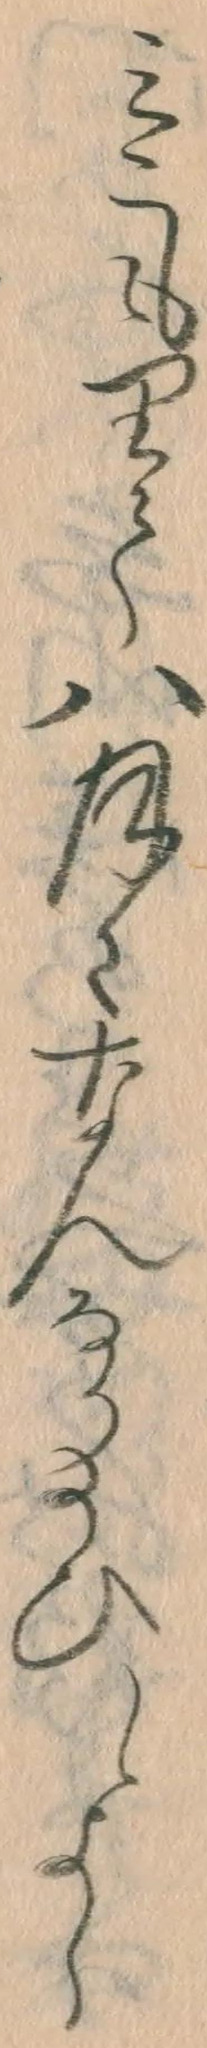ミこもりて八月になんなり玉ひしよし
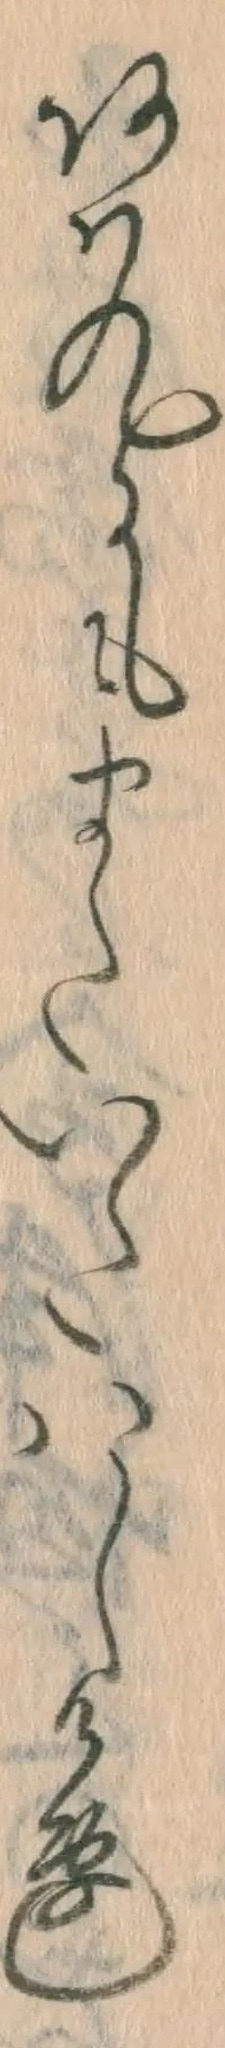あハれにもまたいたハしけれ
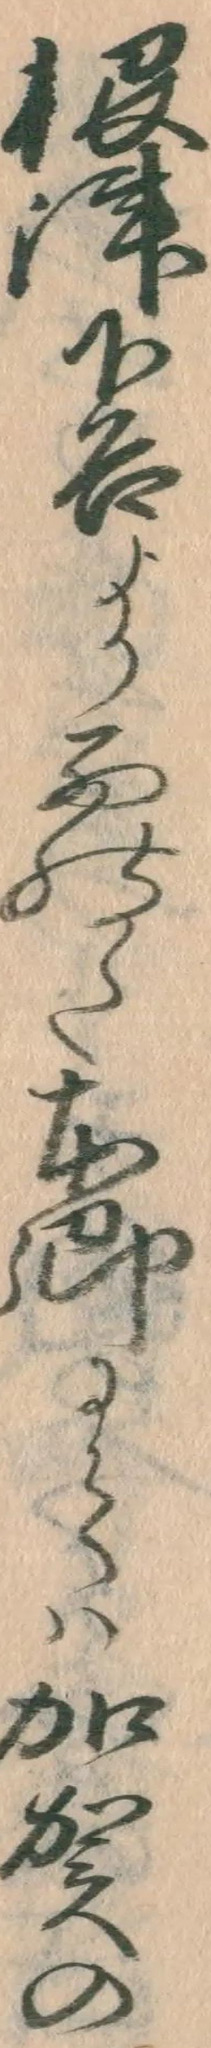根津下谷より西のかた本郷にてハ加賀の
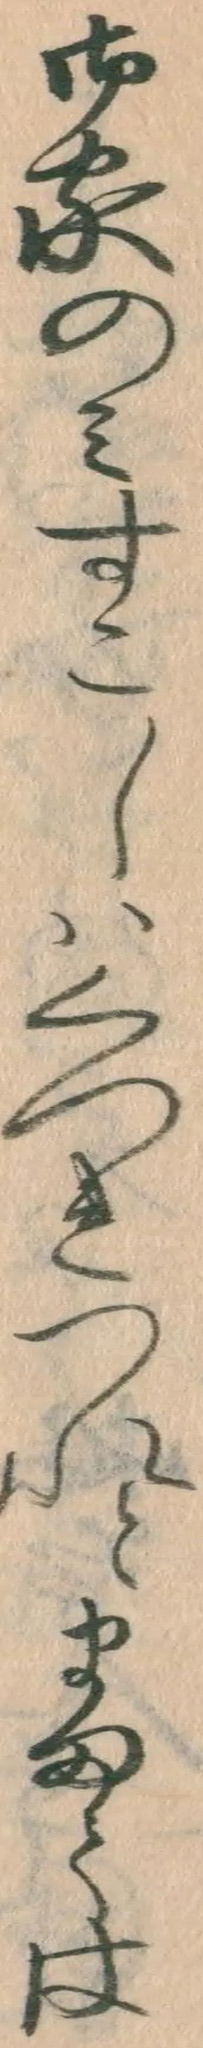御家のミすこしハくつれつれとまるては
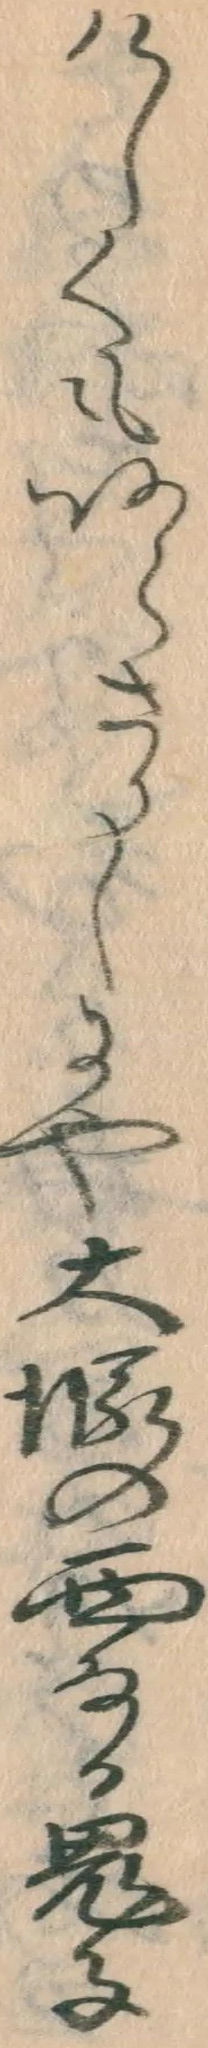けしくもあらさりしにや大塚の西なる鬼子
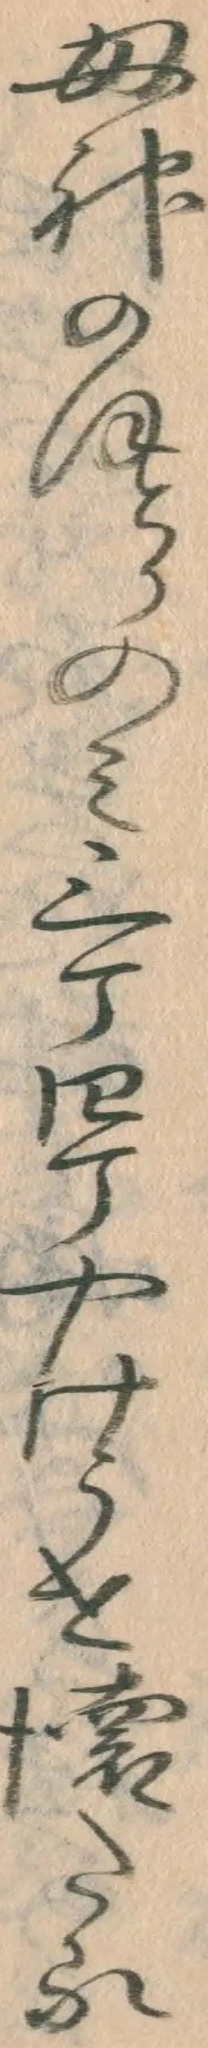母神のほとりのミ三丁四丁やけうせ壊たる
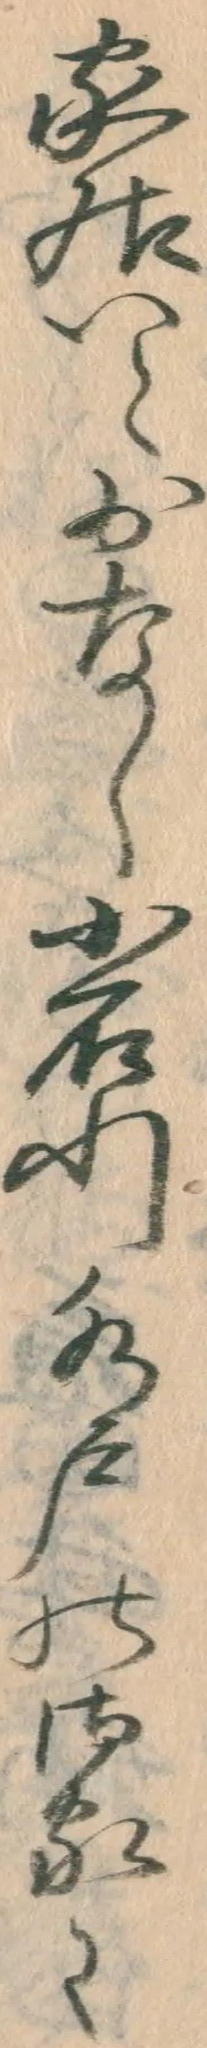家居いと少なし小石川水戸の御家に
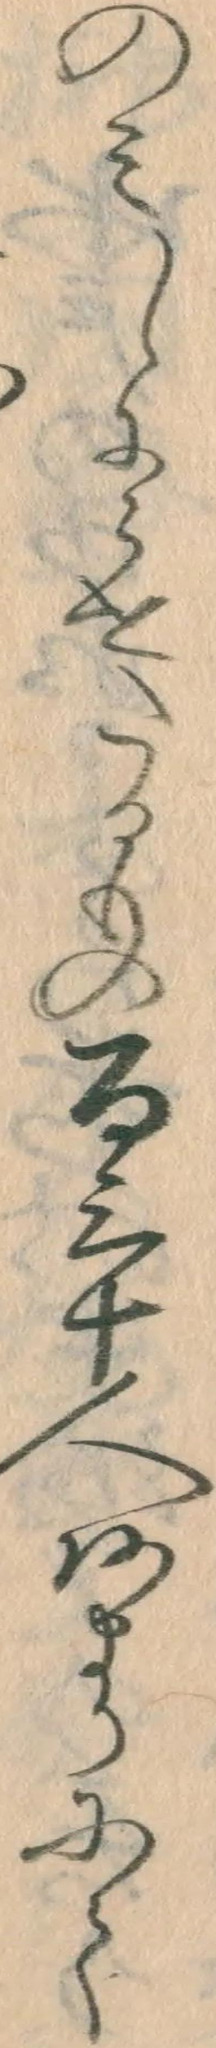のミしにうせたるもの百三十人あまりにて
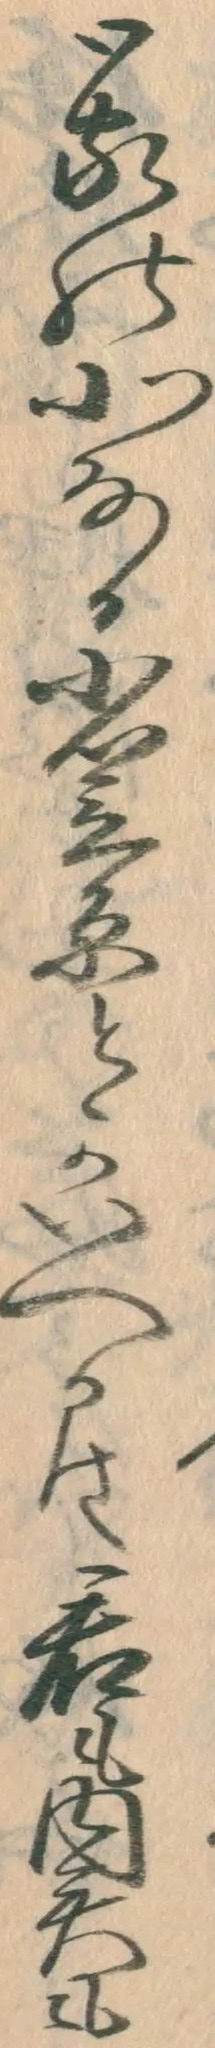御家の北なる小笠原とかいへるは君も内君も

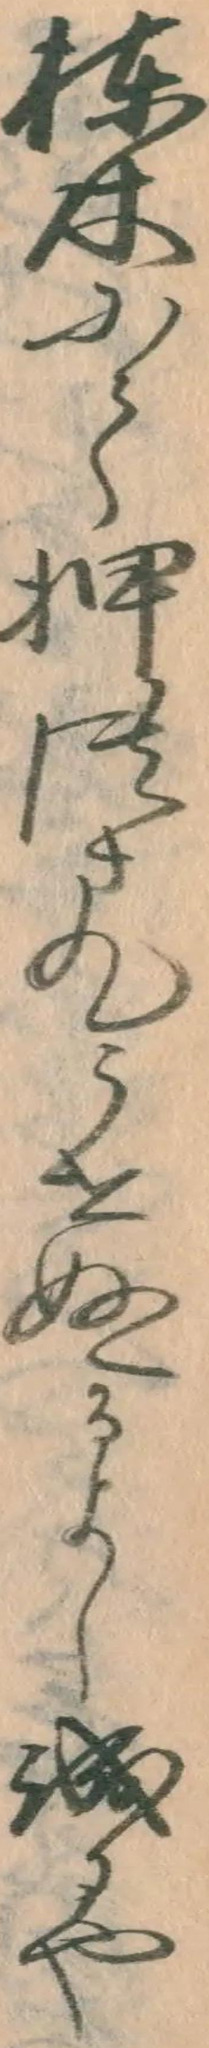棟木にて押潰されうせぬるよし誠にや
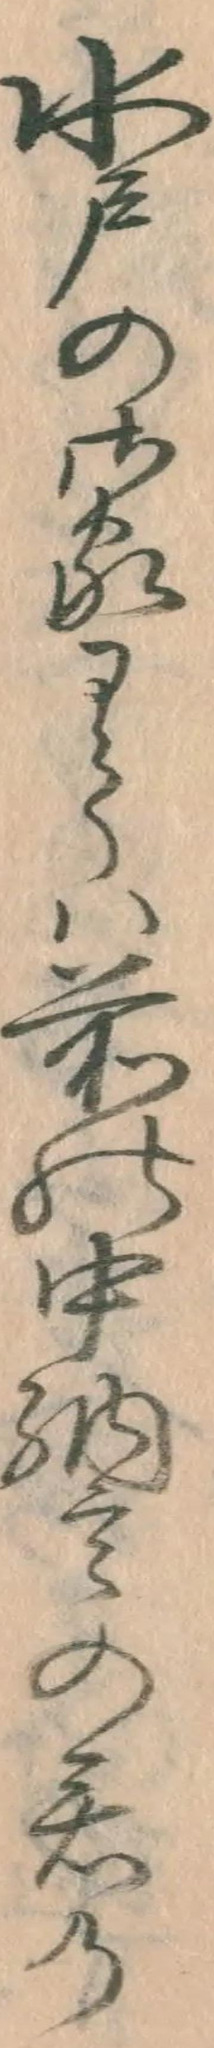水戸の御家にてハ前の中納言の君の
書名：麗斎叢書. 20
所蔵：国立国会図書館 National Diet Library, JAPAN
